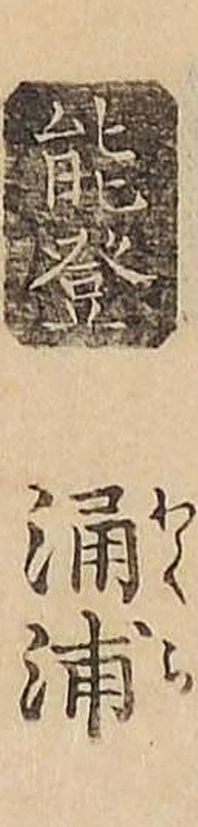能登涌浦
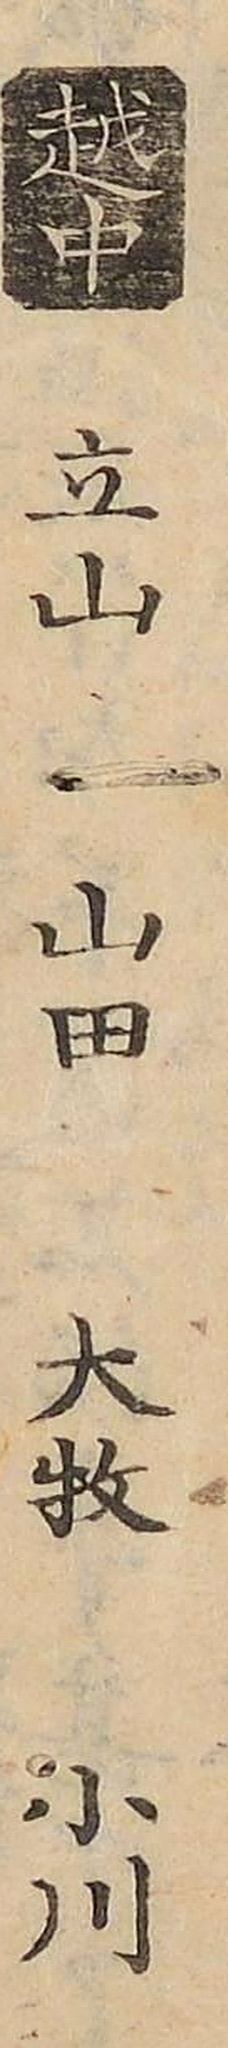越中立山山田大牧小川
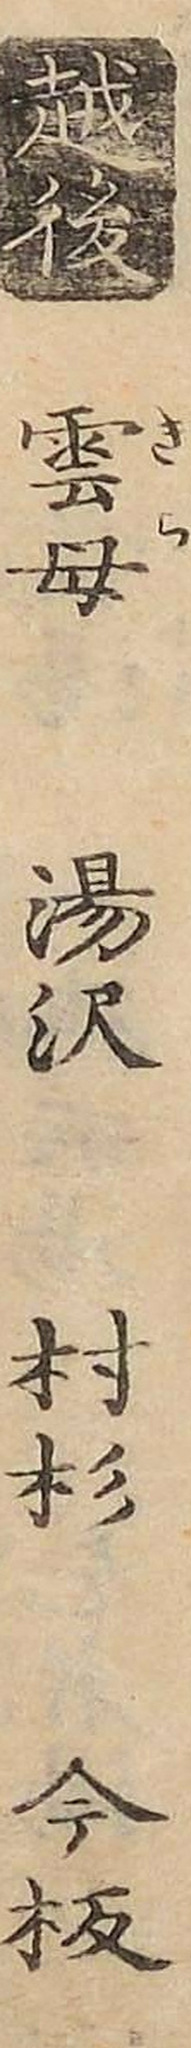越後雲母湯沢村杉今板
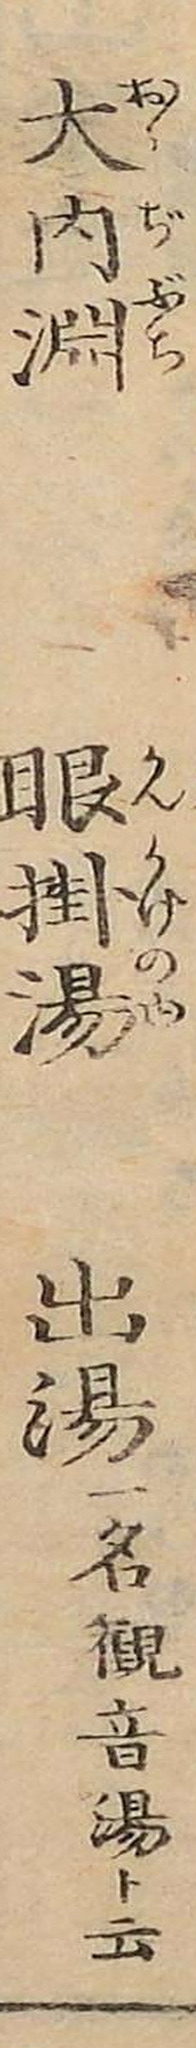大内淵眼掛湯出湯一名観音湯ト云

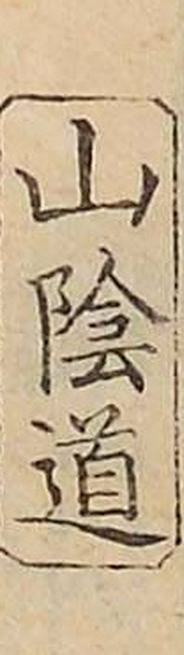山陰道
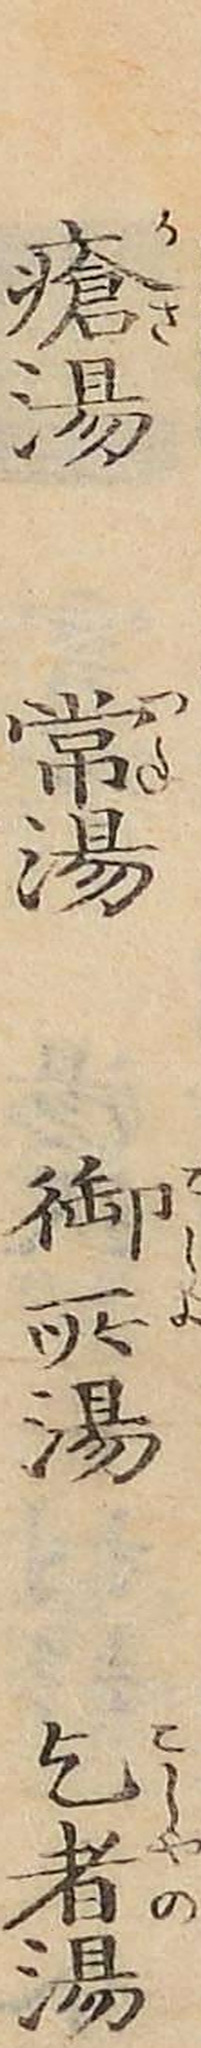瘡湯常湯御所湯乞者湯
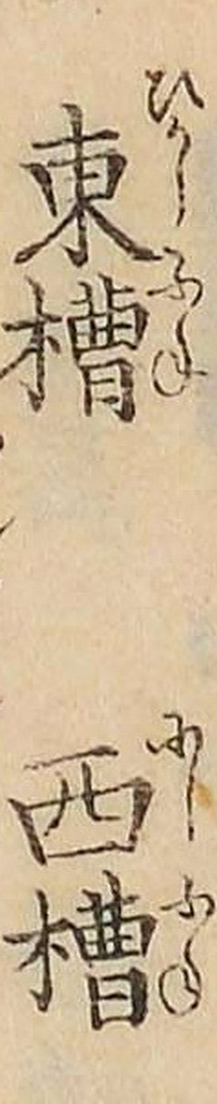東槽西槽
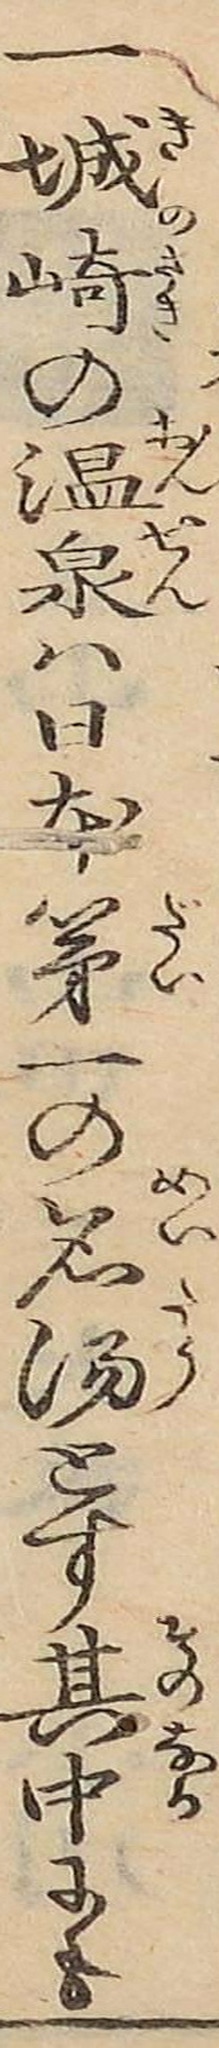一城崎の温泉は日本第一の名湯とす其中にも
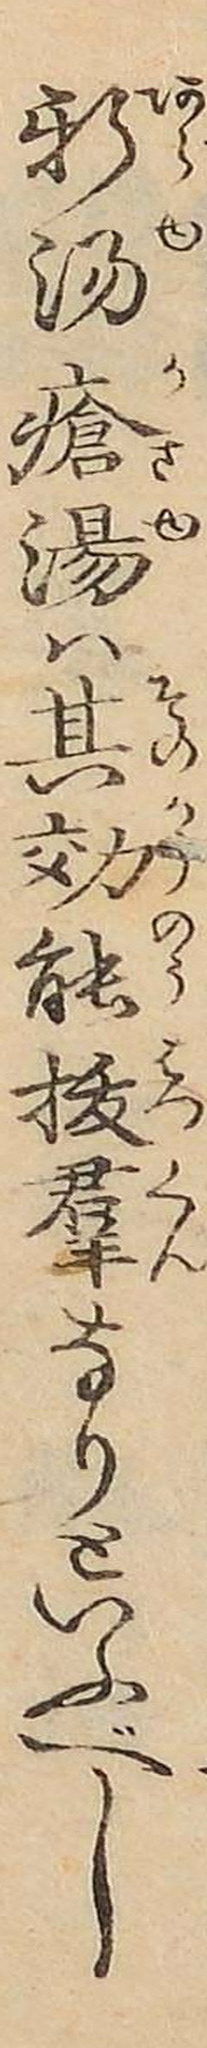新湯瘡湯は其効能抜群なりといふべし
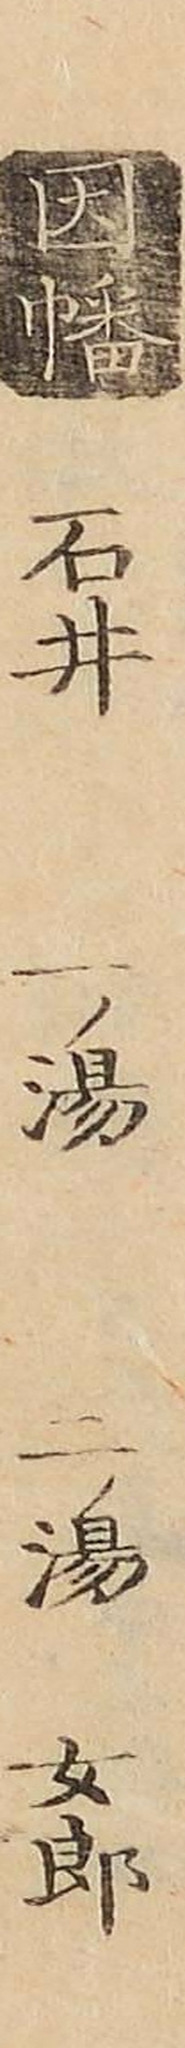因幡石井一湯二湯女郎
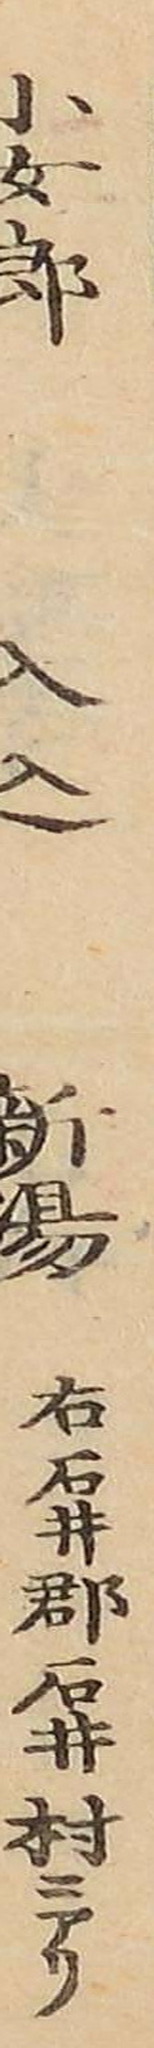小女郎入込新湯右石井郡石井村ニアリ
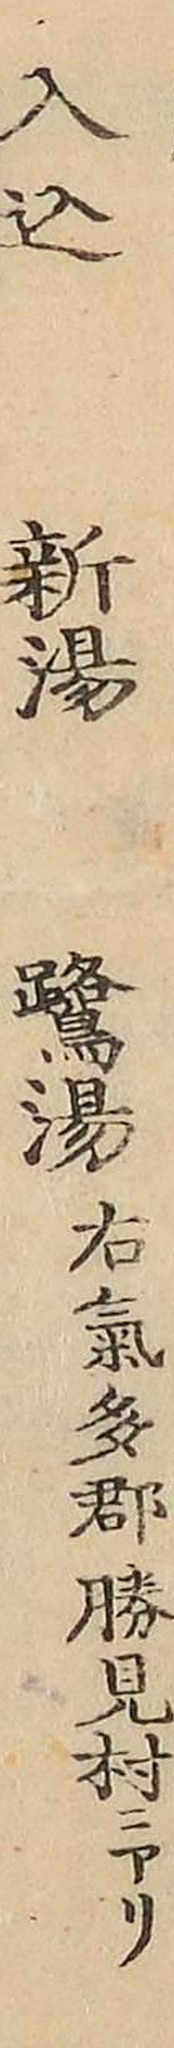入込新湯鷺湯右気多郡勝見村ニアリ
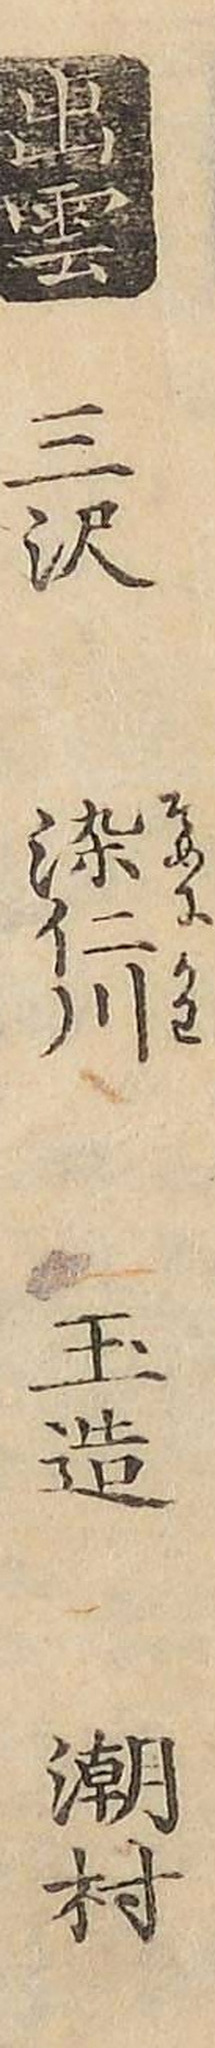出雲三沢染仁川玉造潮村
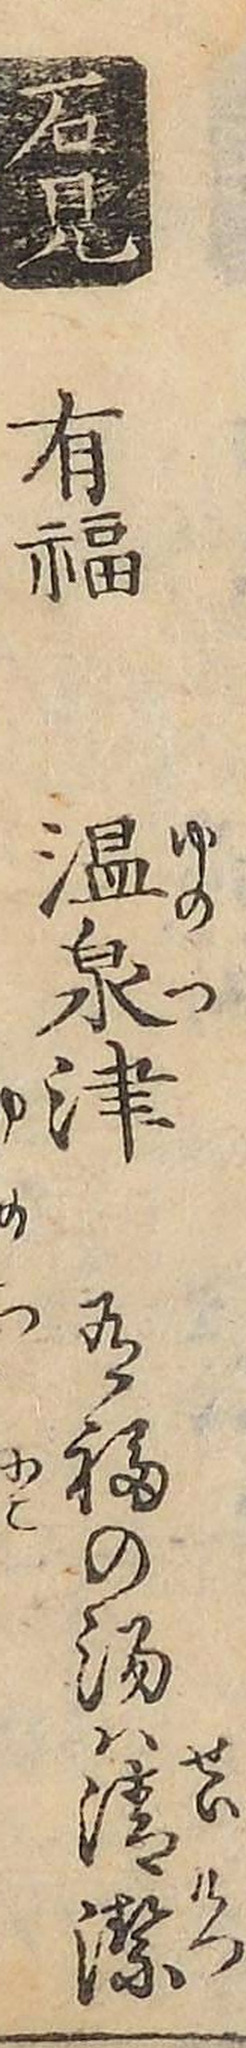石見有福温泉津有福の湯は清潔
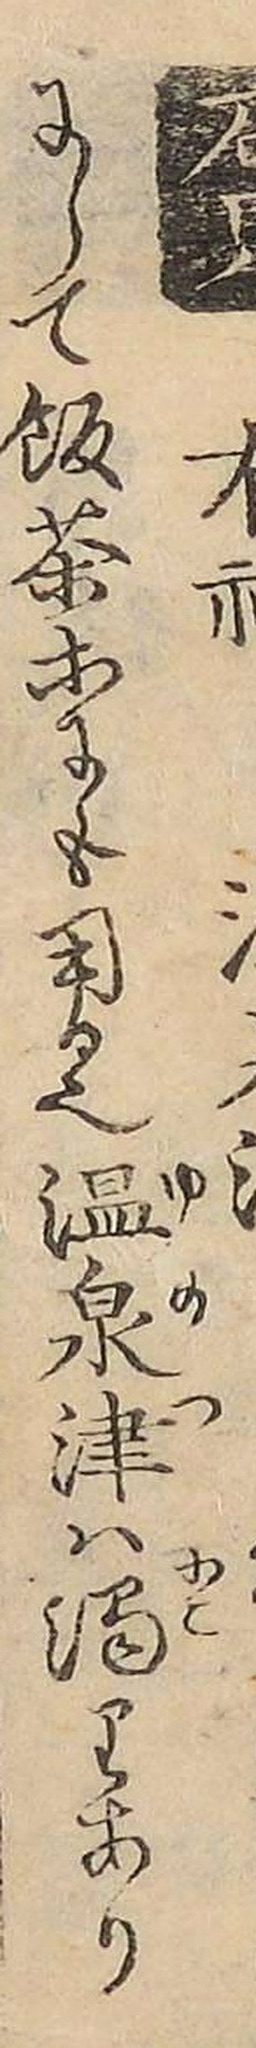にして飯茶等にも用る也温泉津は濁りあり

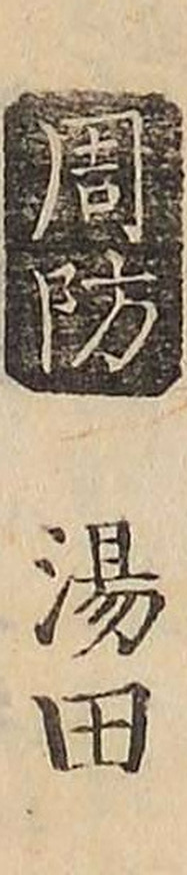周防湯田
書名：旅行用心集
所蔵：神戸大学附属図書館 国文学研究資料館
